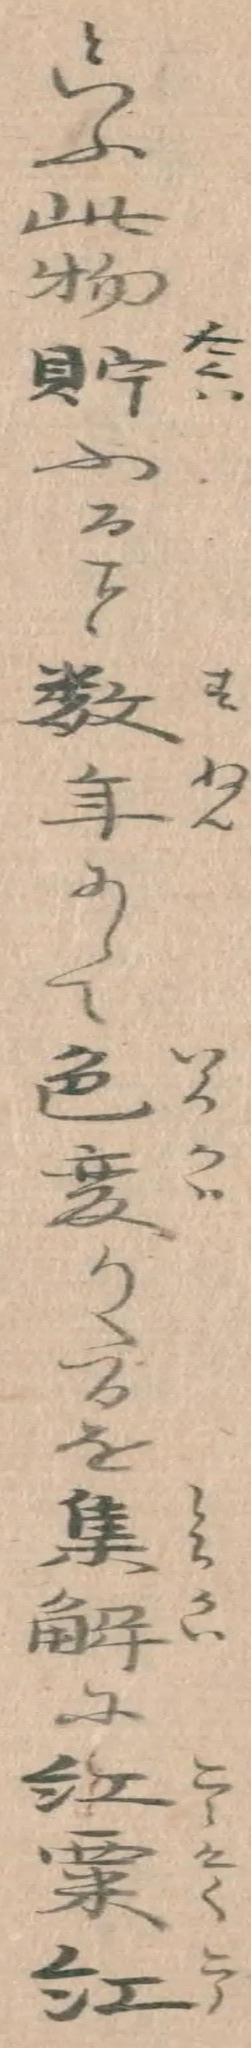といふ此物貯ふること数年にして色変りたるを集解に紅粟紅
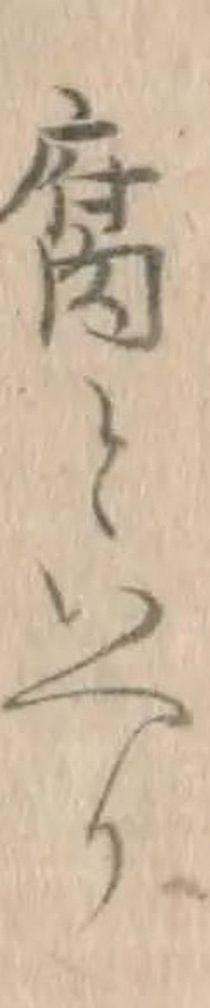腐といへり
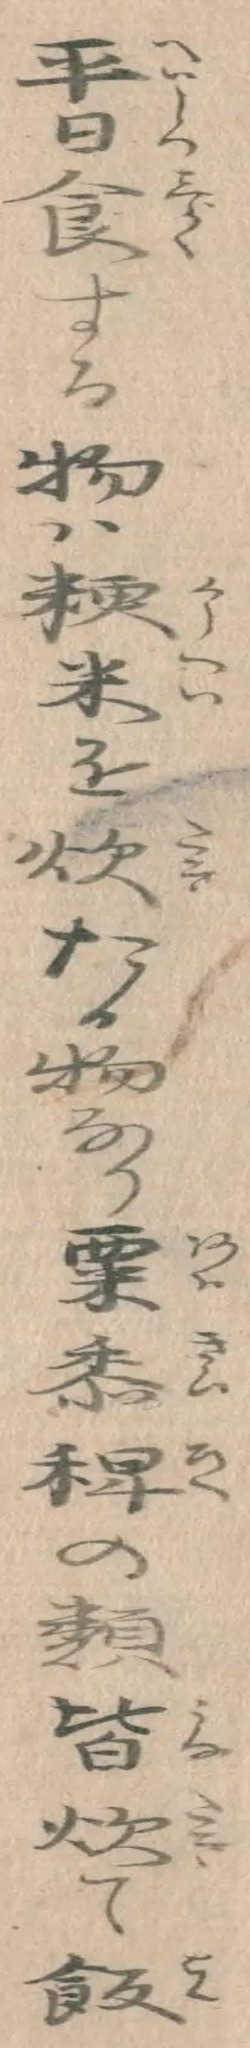平日食する物は粳米を炊たる物なり粟黍稗の類皆炊て飯
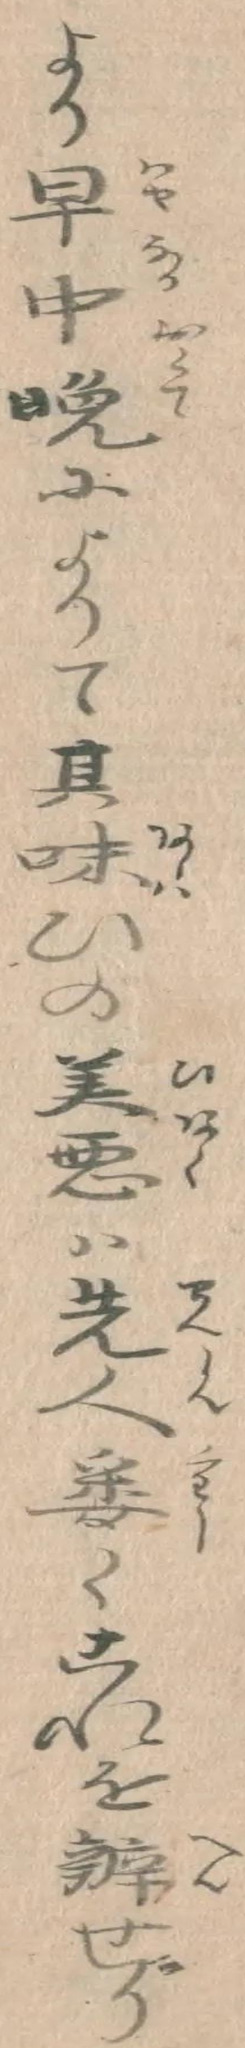より早中晩によりて其味ひの美悪は先人くこれを弁せり
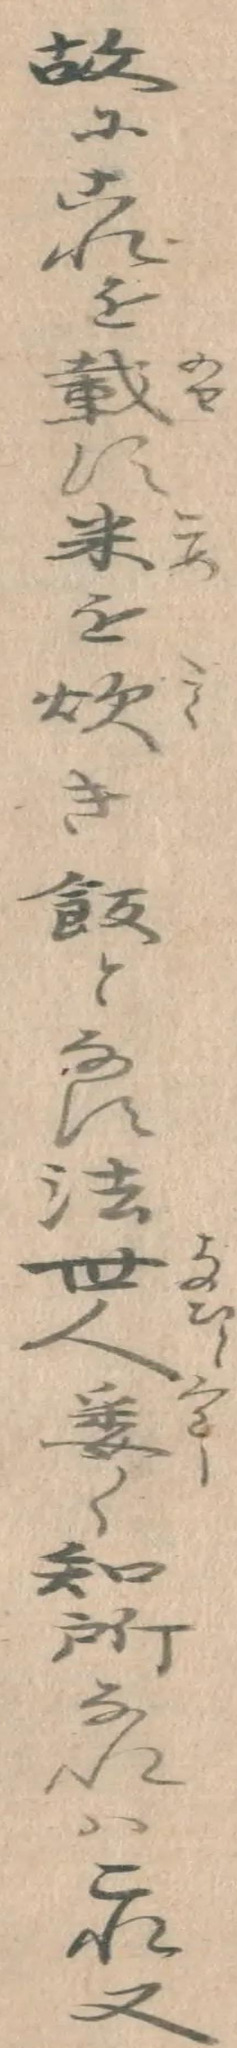故にこれを載す米を炊き飯となす法世人く知所なれはこれ又

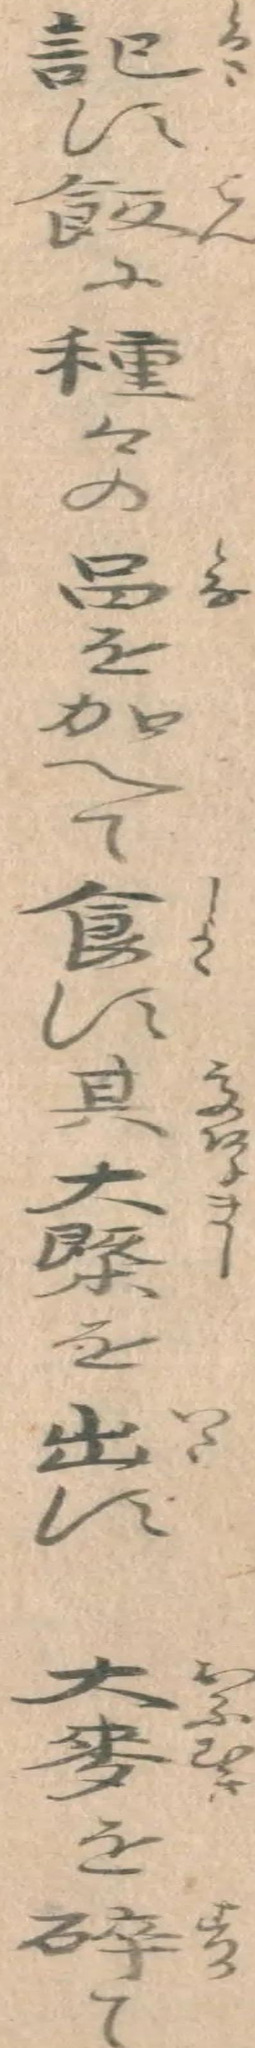記す飯に種々の品を加へて食す其大概を出す大麦を砕て
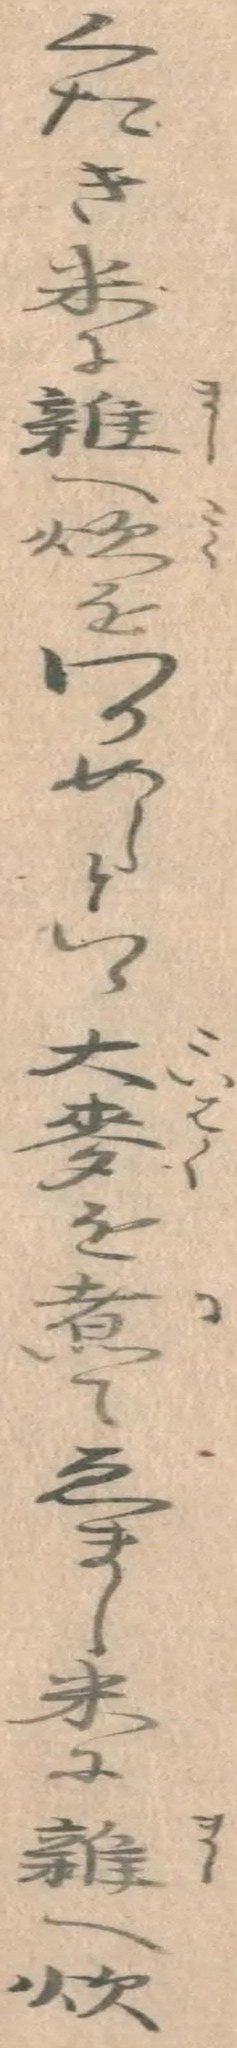くたき米に雑へ炊をわりめしといゝ大麦を煮てゑまし米に雑へ炊
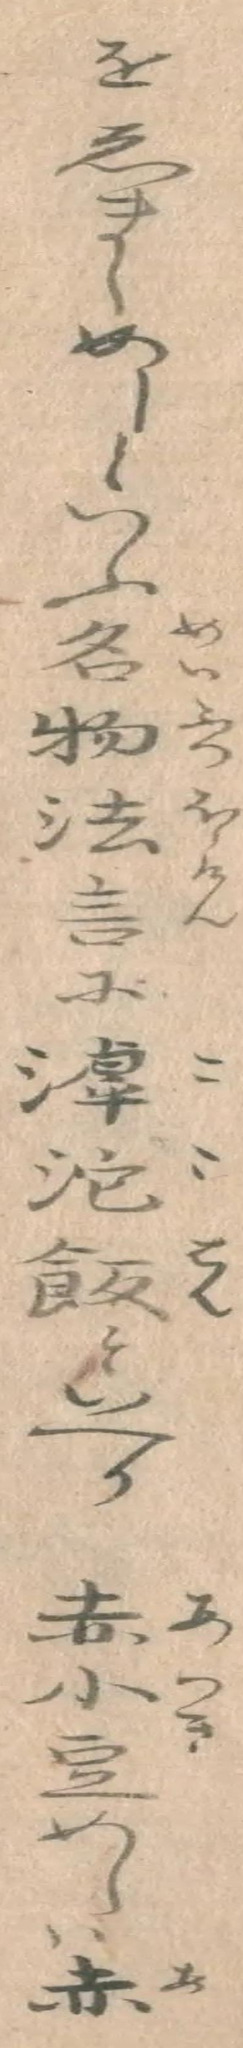をゑましめしといふ名物法言に滹沱飯といへり赤小豆めしは赤
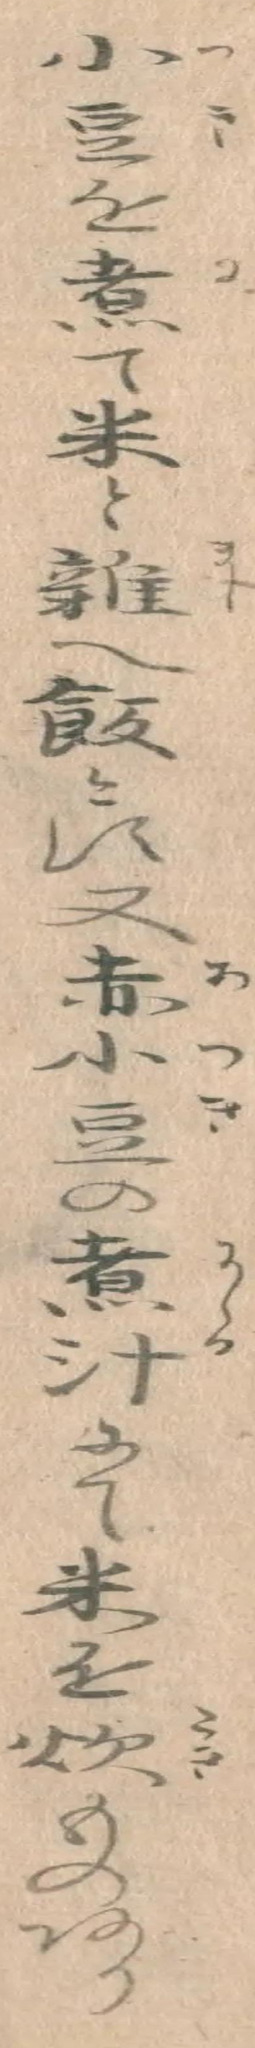小豆を煮て米と雑へ飯とす又赤小豆の煮汁にて米を炊ものあり
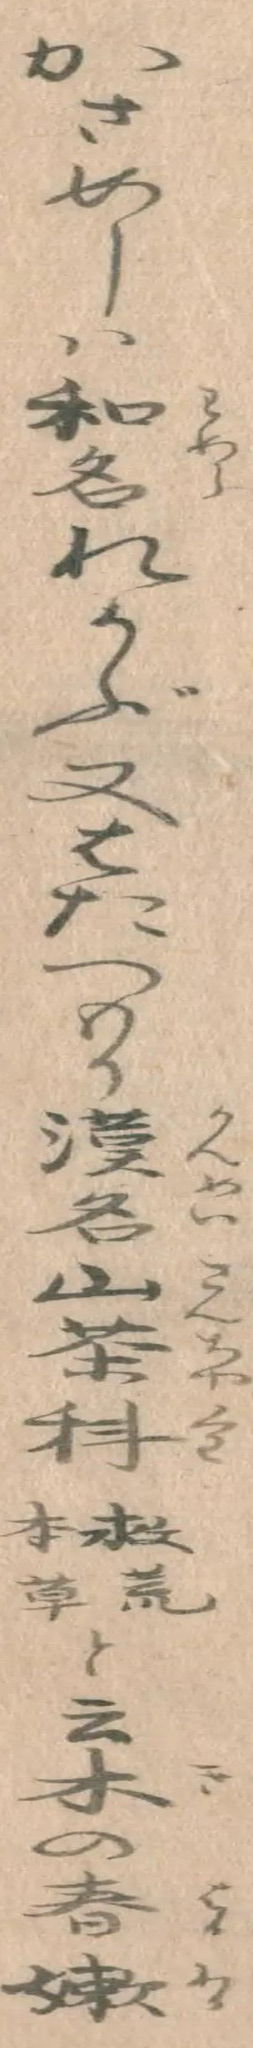かさめしは和名れうぶ又はたつもり漢名山茶科救荒本草と云木の春嫩
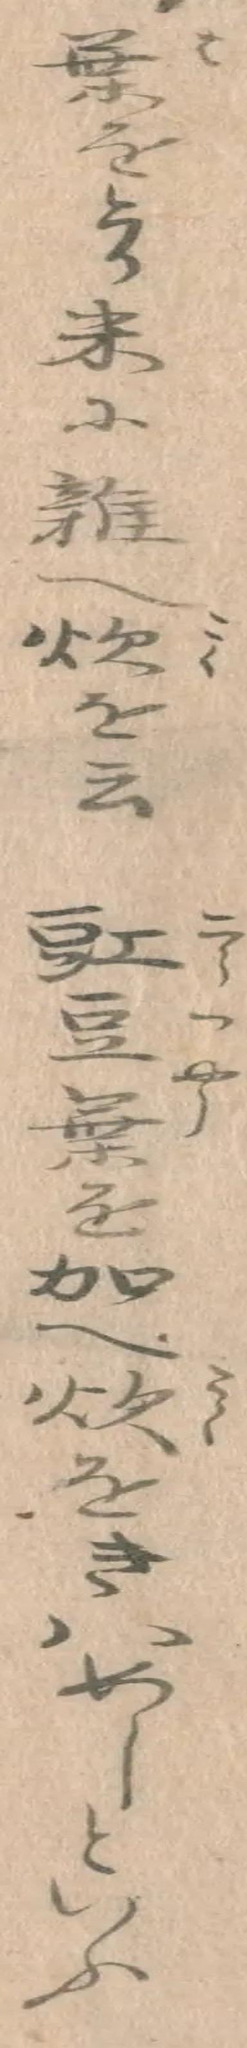葉をとり米に雑へ炊を云豇豆葉を加へ炊をきはめしといふ
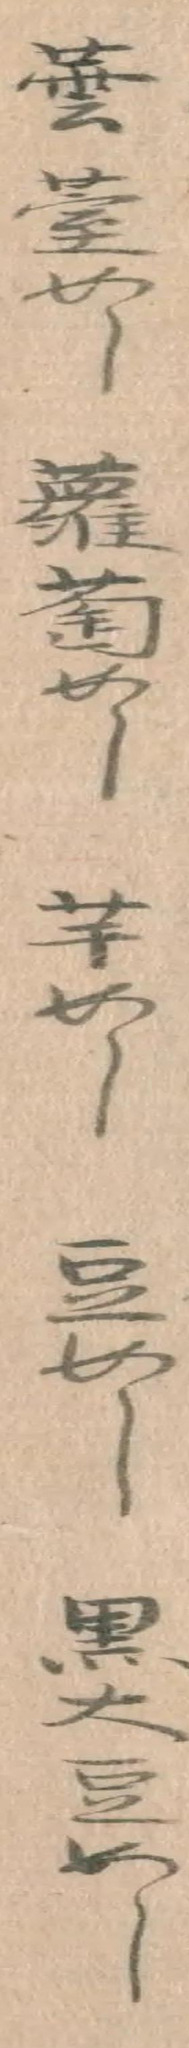蕓𮏧めし蘿萄めし芋めし豆めし黒大豆めし
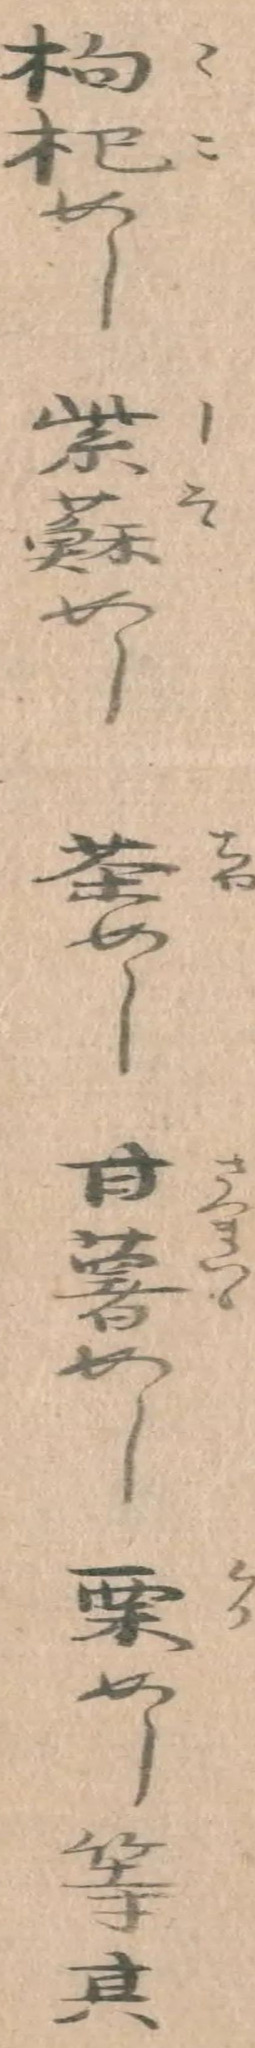枸杞めし紫蘇めし茶めし甘薯めし栗めし等其
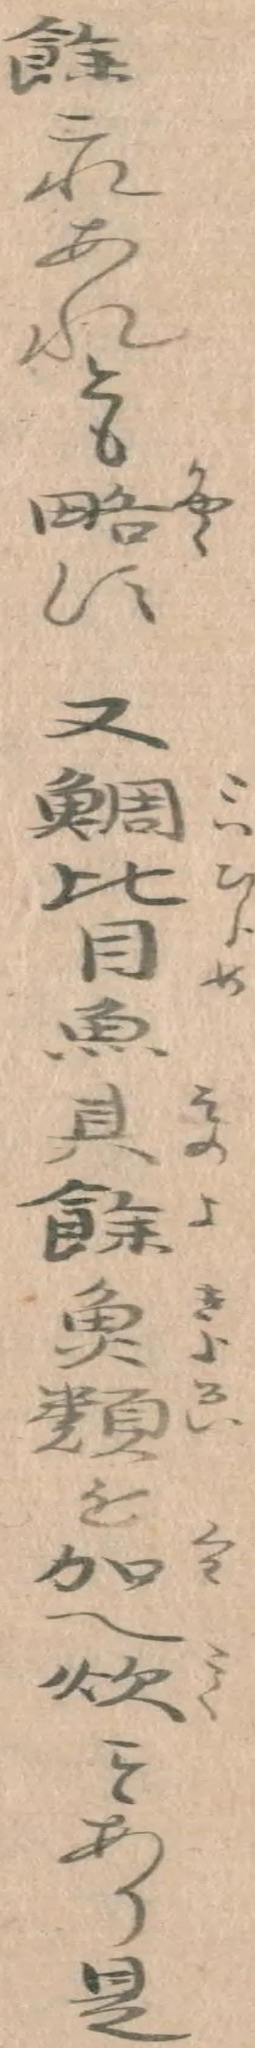余これあれとも略す又鯛比目魚其余魚類を加へ炊ことあり是
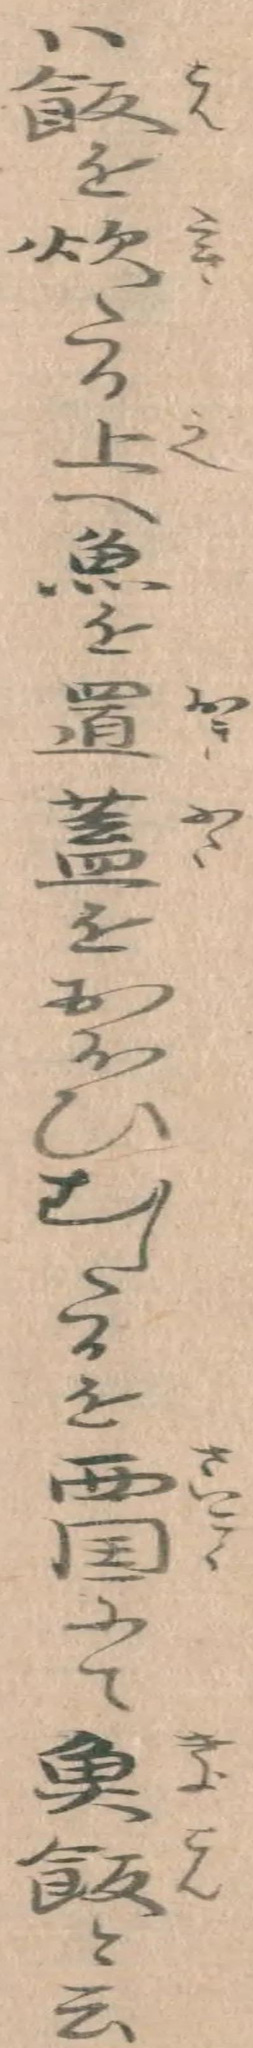は飯を炊たる上へ魚を置蓋をおほひむしたるを西国にて魚飯と云
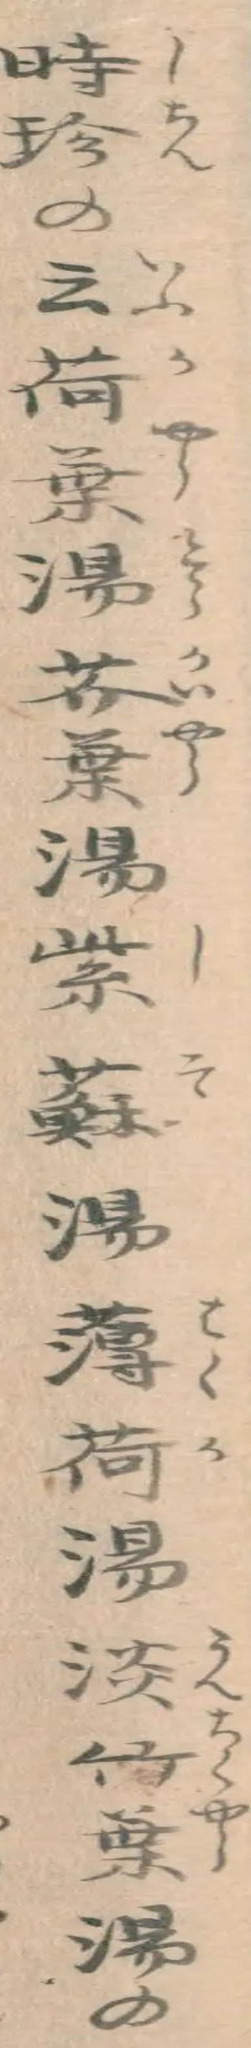時珍の云荷葉湯芥葉湯紫蘇湯薄荷湯淡竹葉湯の
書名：本草図譜. 巻43-45
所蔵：国立国会図書館 National Diet Library, JAPAN
